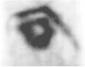司
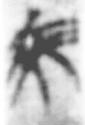馬
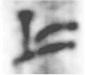之
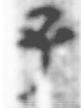子（牸）
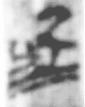爲
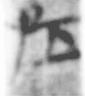○（左）
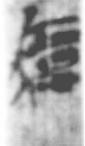驂
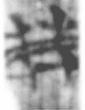𣗥（束）
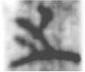之
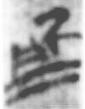爲
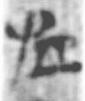○（左）
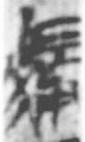○（服）
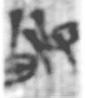○（田）
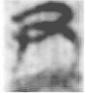尹
